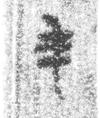屯
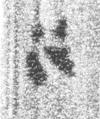厀（漆）
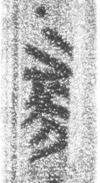○（畫）
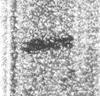一
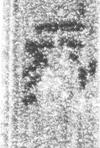房
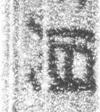○（俎）
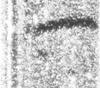一
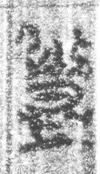簦
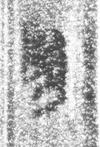桱
